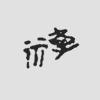禕
